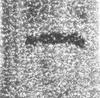一
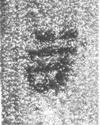司（笥）
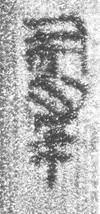○（翠）
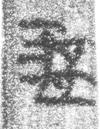珥
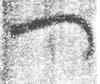一
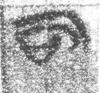司（笥）
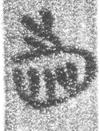齒
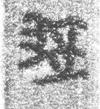珥
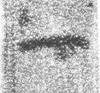一
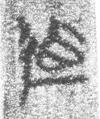組
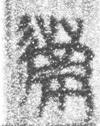○（帶）
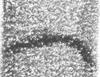一
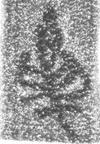革
